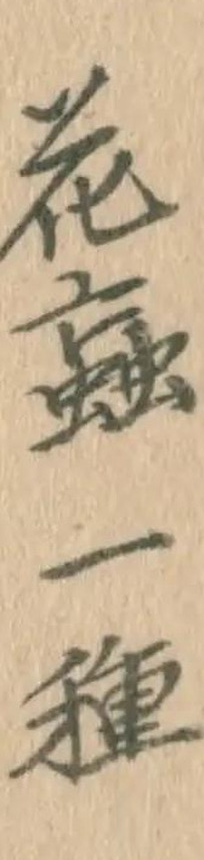花蝱一種
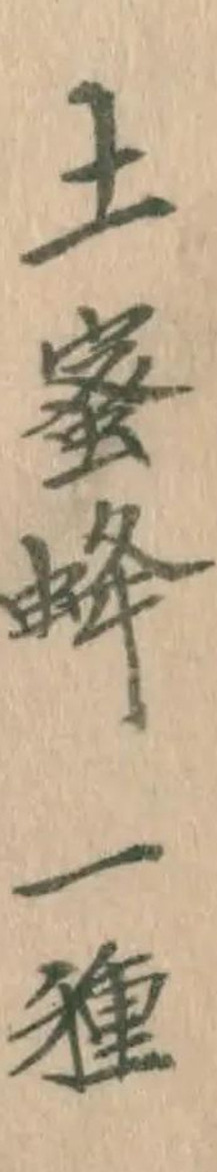土蜜蜂一種
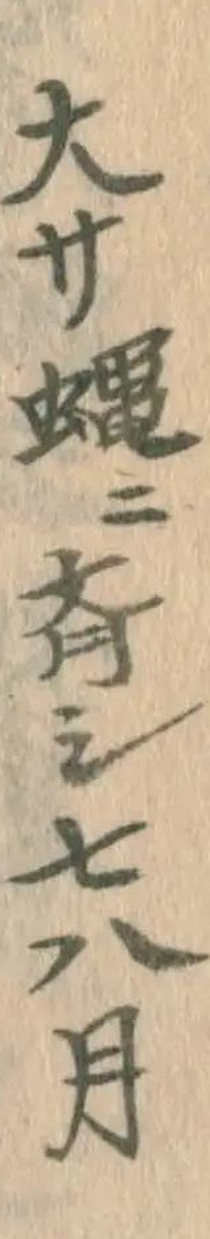大サ蝿ニ斉シ七八月
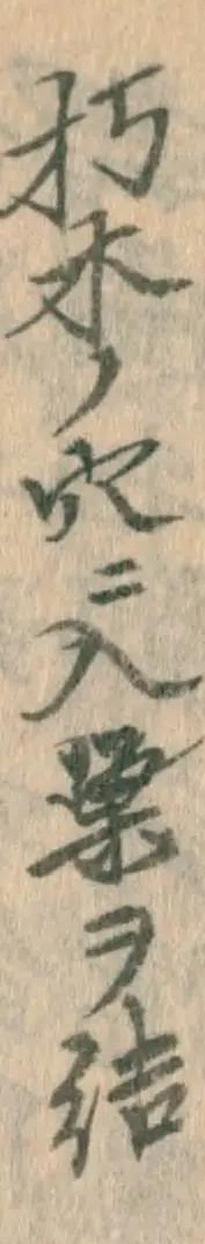朽木ノ穴ニ入巣ヲ結
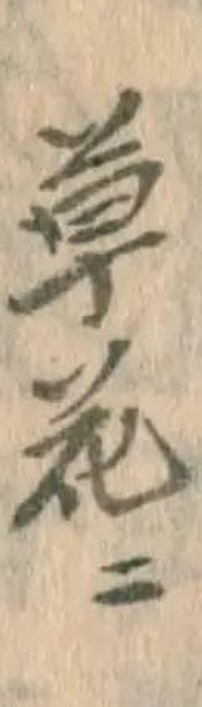草花ニ
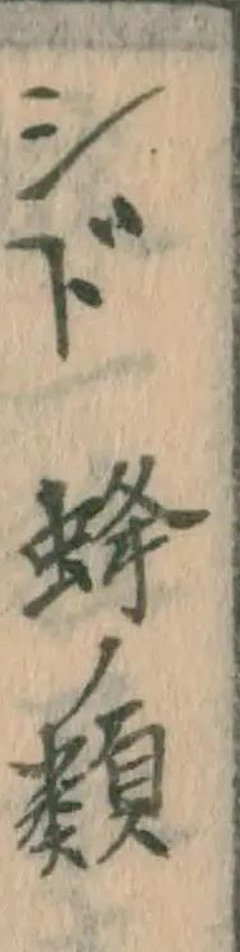シド蜂ノ類
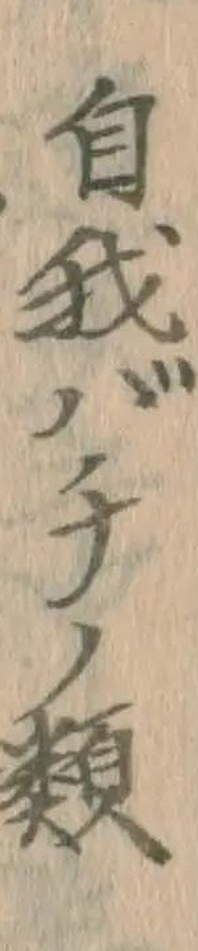自我バチノ類
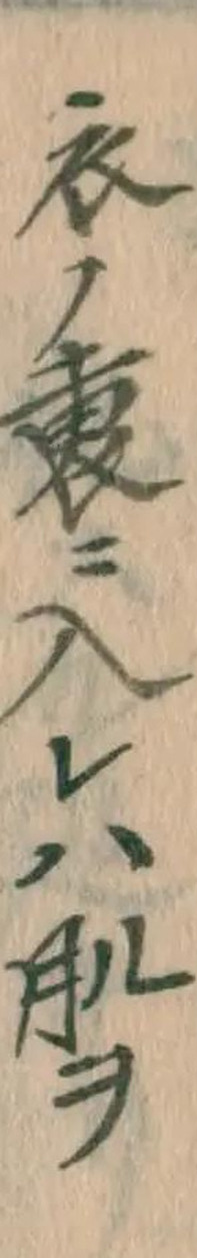衣ノ裏ニ入レハ肌ヲ
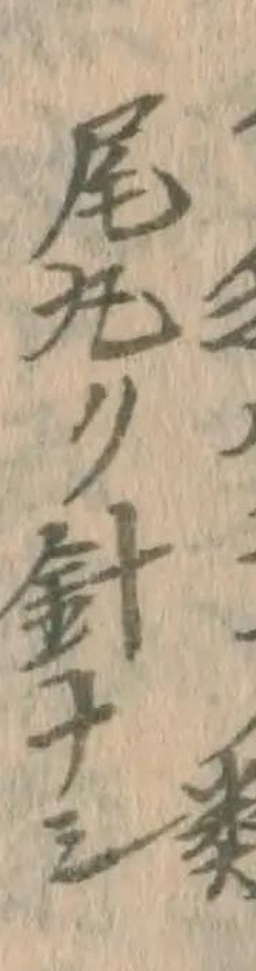尾丸ク針ナシ
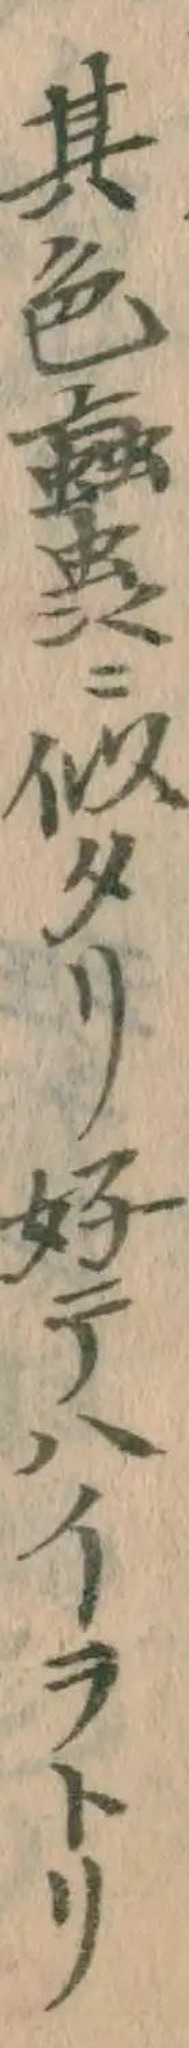其色蝱蟲ニ似タリ好テハイヲトリ
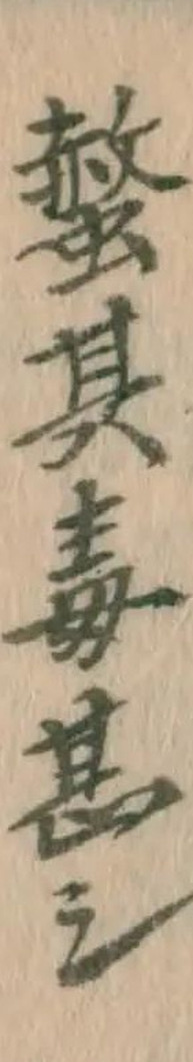螫其毒甚シ
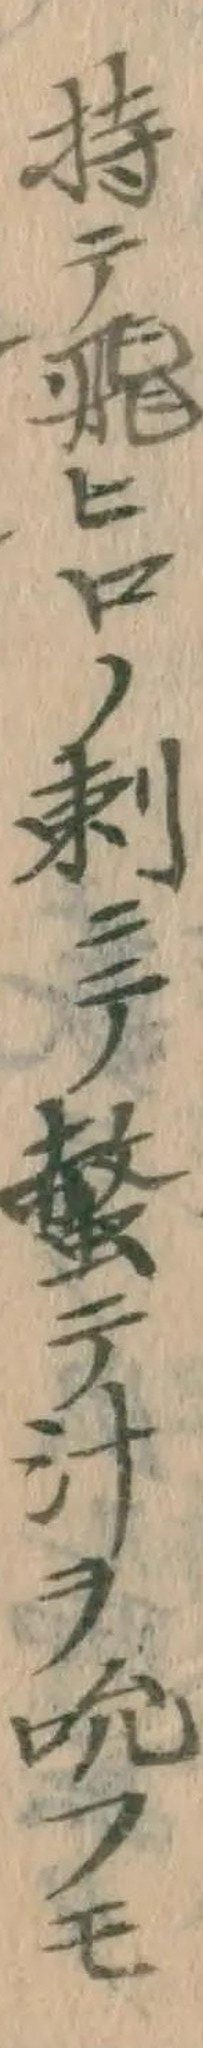持テ飛ヒ口ノ刺ニテ螫シテシルヲ吮フモ
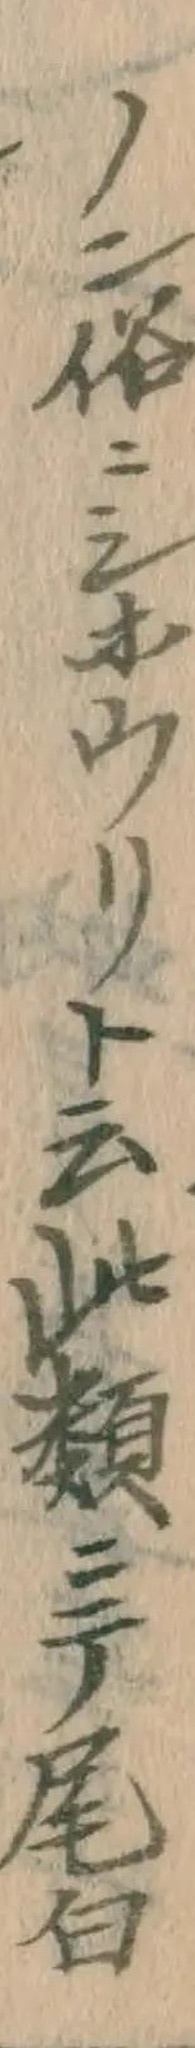ノニ俗ニシホウリト云此類ニテ尾白

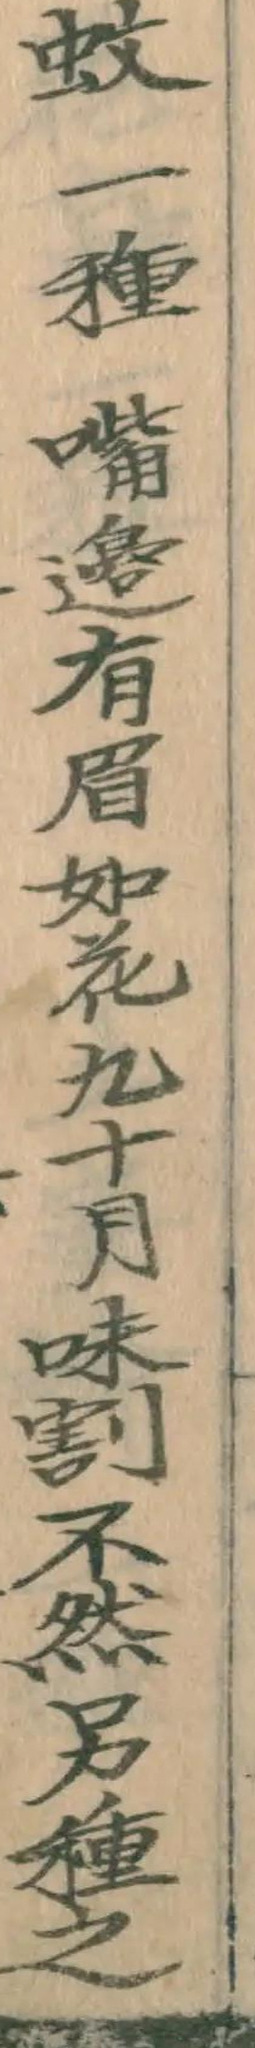蚊一種嘴邉有眉九十月味割不然另種之
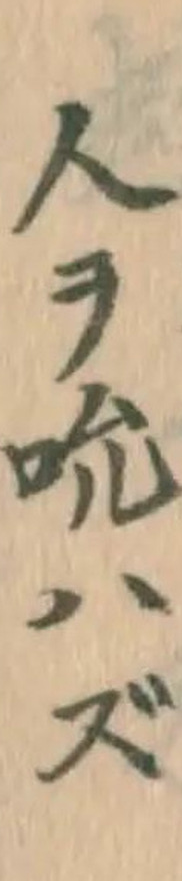人ヲ吮ハズ
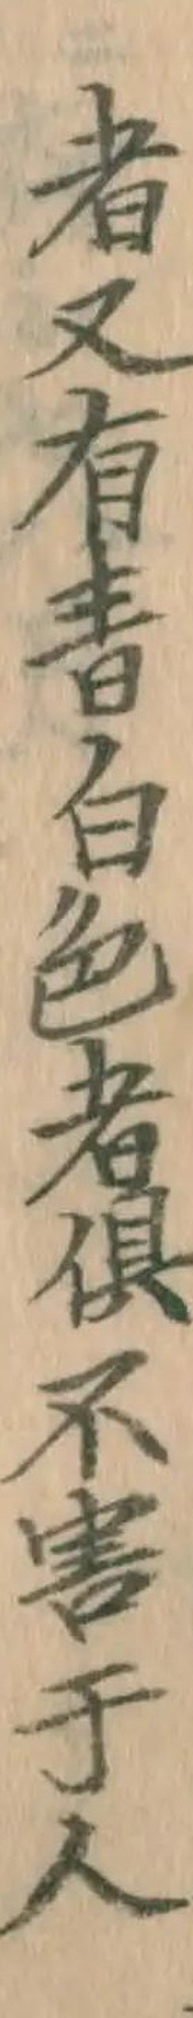者又有青白色者倶不害于人
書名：千蟲譜 3巻. [2]
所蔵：国立国会図書館 National Diet Library, JAPAN
